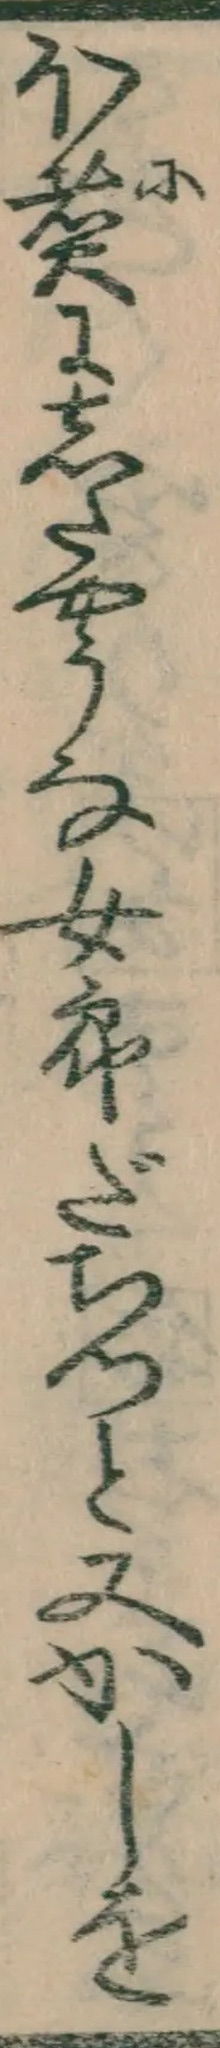ほ煮にしたやうな女郎だちつと又かしを
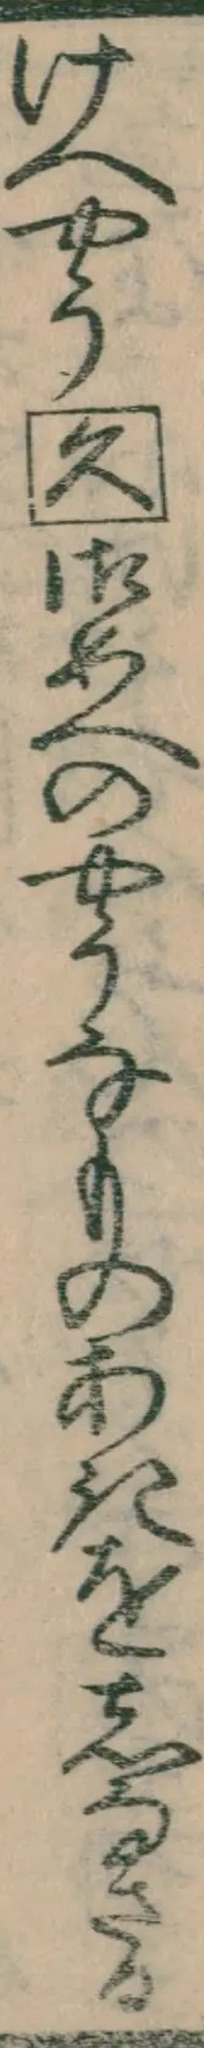けへやう〈久〉御めへのやうなものあきをしなさる
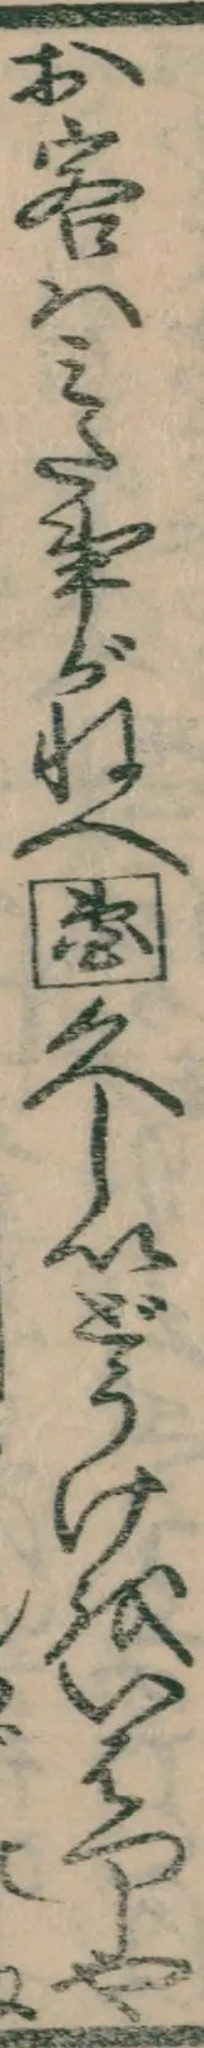お客はみた事がねへ〈団〉久しいどうけをいはつしや
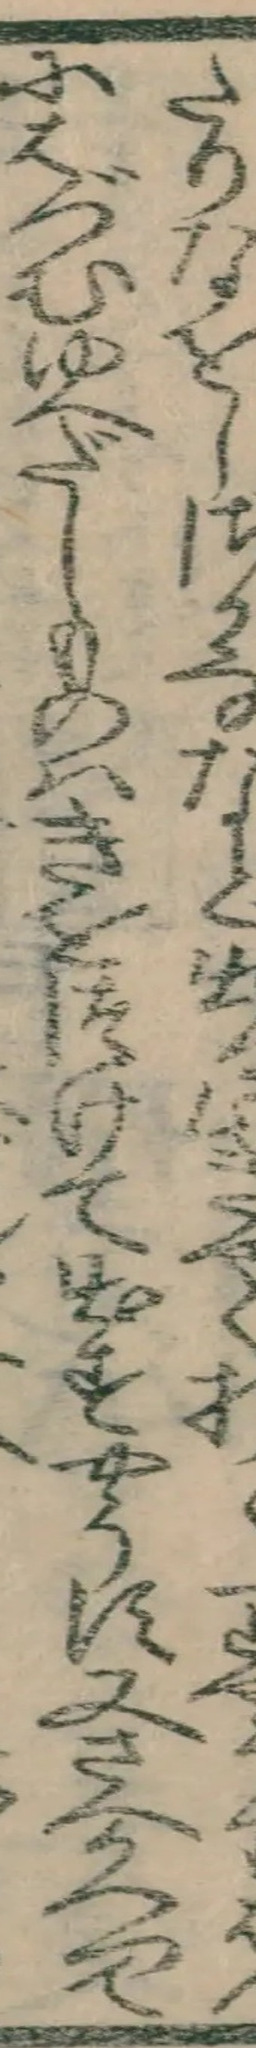にはづむゆへだしものはきをつけて出すやうす又さへかへつて
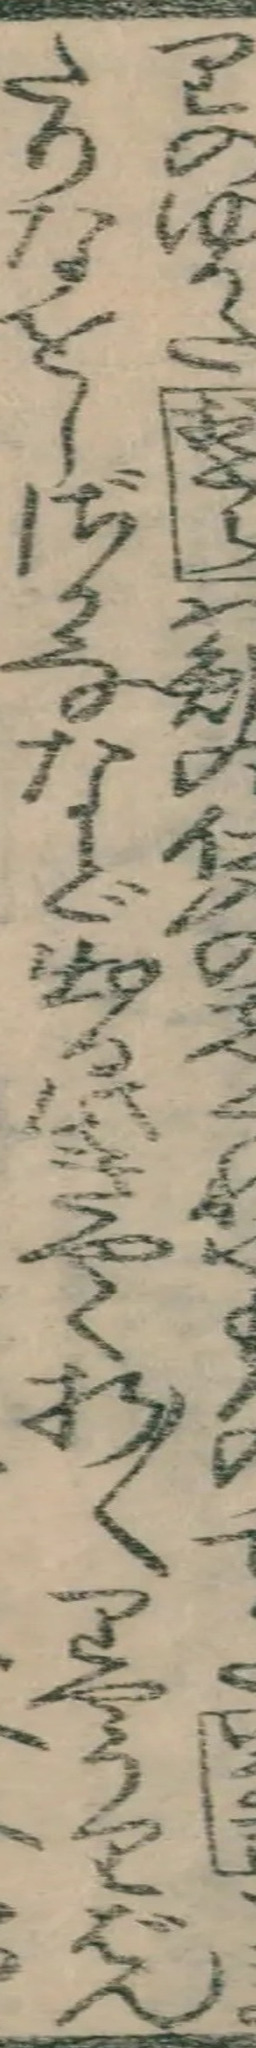たりなをしざかななど出る此きやく折〳〵りやうりばん
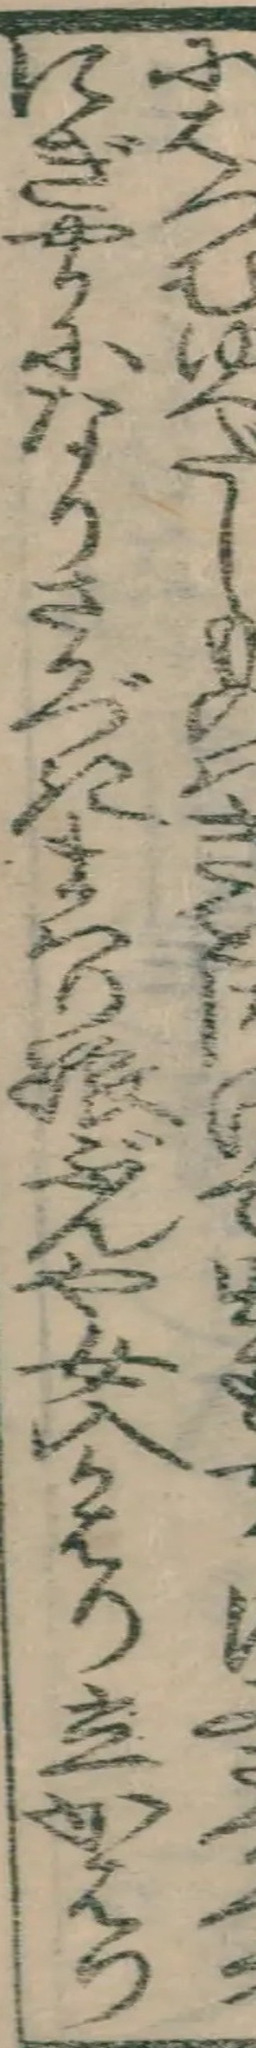にぎやかになりさかづきまはり娘ぶんや女入かはり立かはり

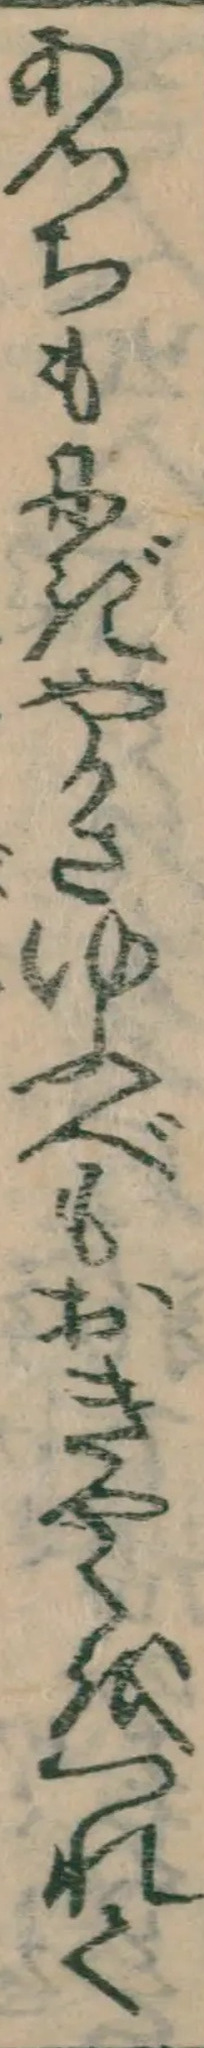あつちもにぎやかさゆふべもおきやくをつれて
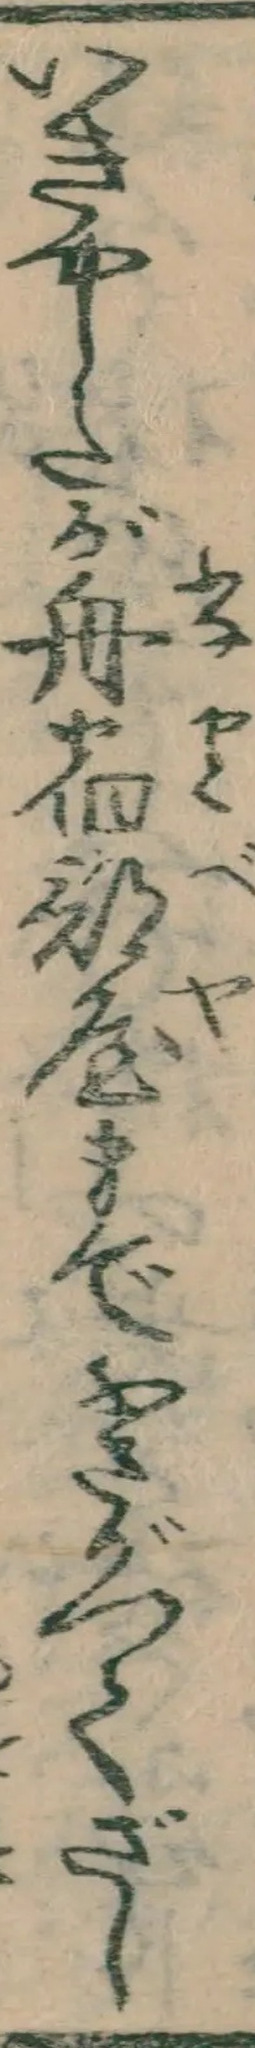いきやしたが舟宿部屋までふさがつてざし
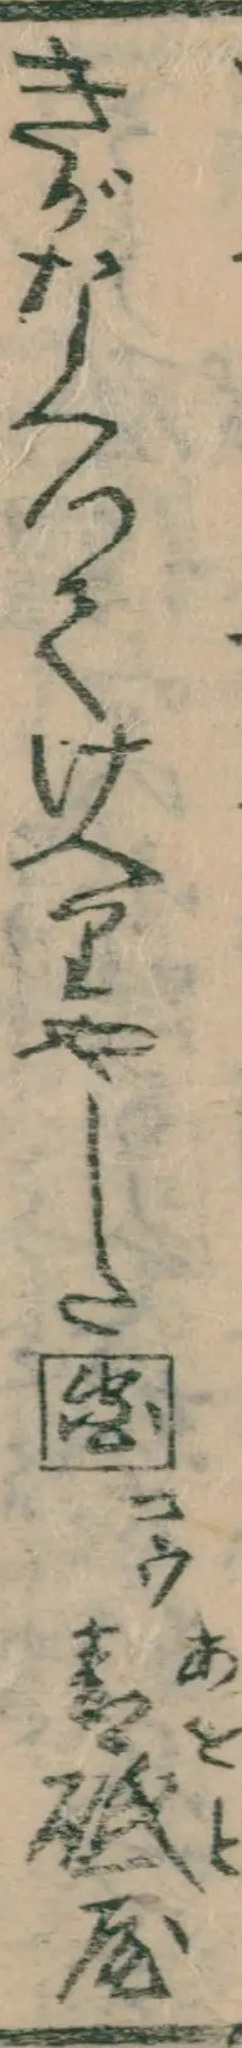きがなくつてけへりやした〈団〉コウ青砥屋
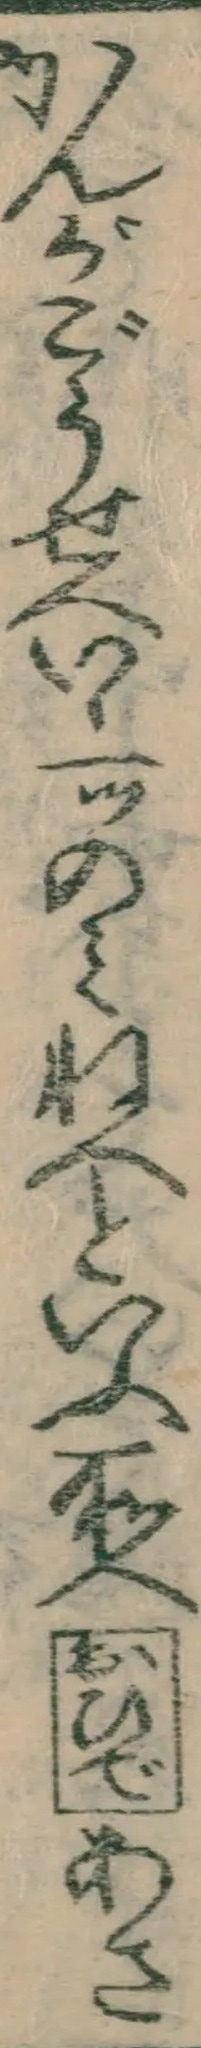かんがごうせへいゝ一ツのみねへといふ所へ〈おひで〉あさ
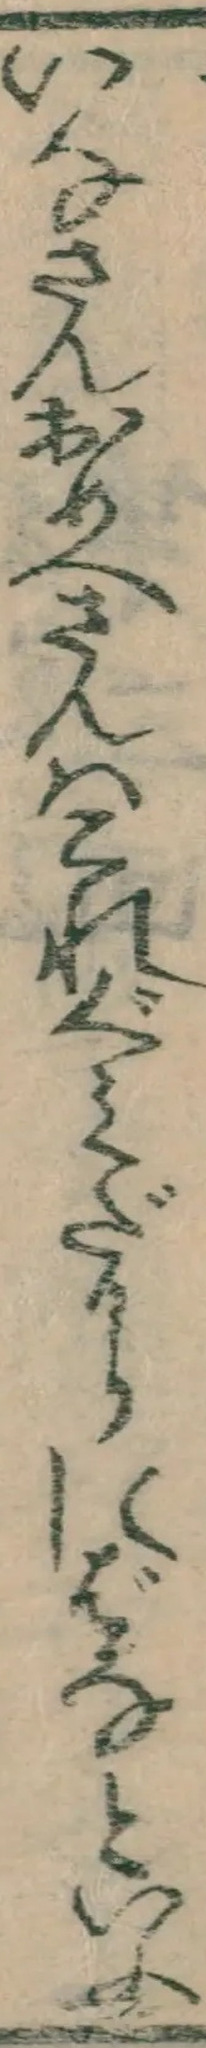いなきんおめへさんはこれぐみだからにばなといふ
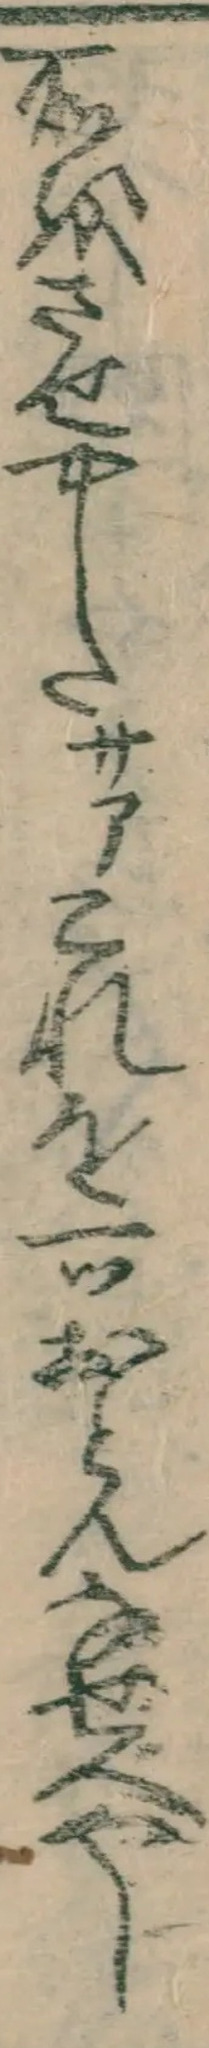所をさせやしたサアこれを一ツおとんなせへやし
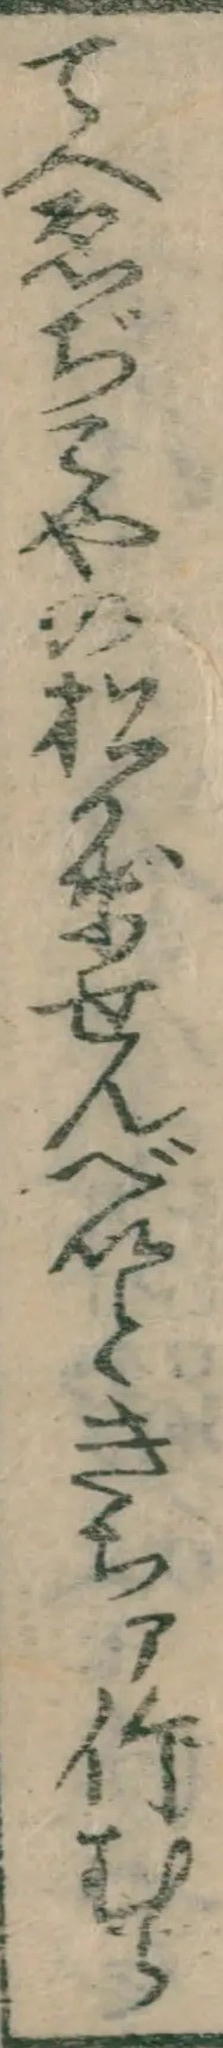てへゑぢこやの松かせせんべいときちァ竹むら

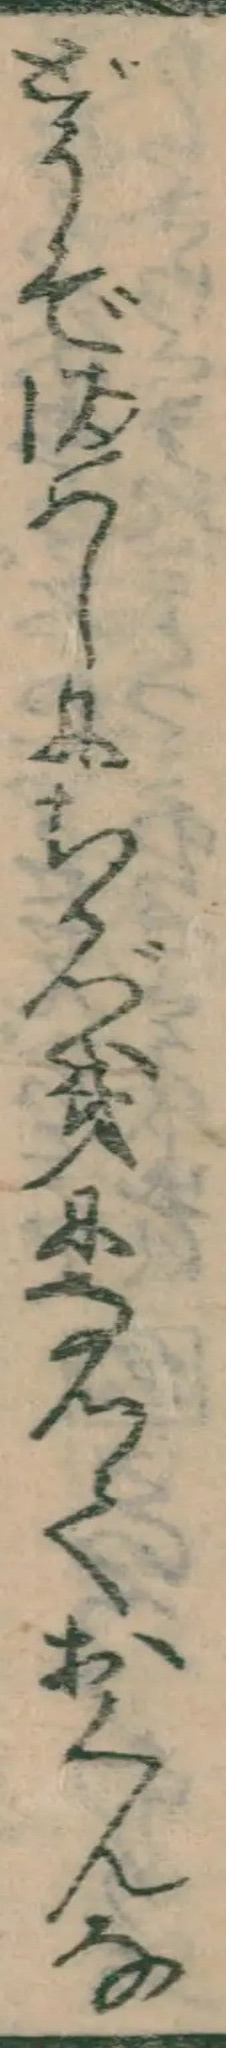どうでまはしにちかづきになつておくんな
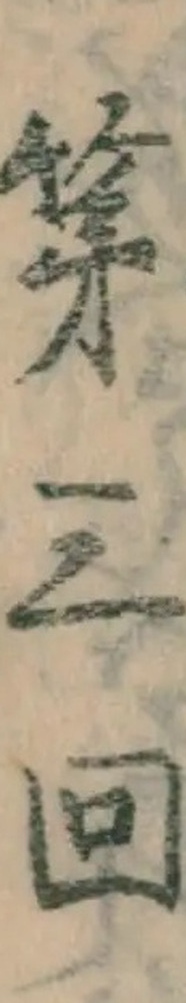第三回
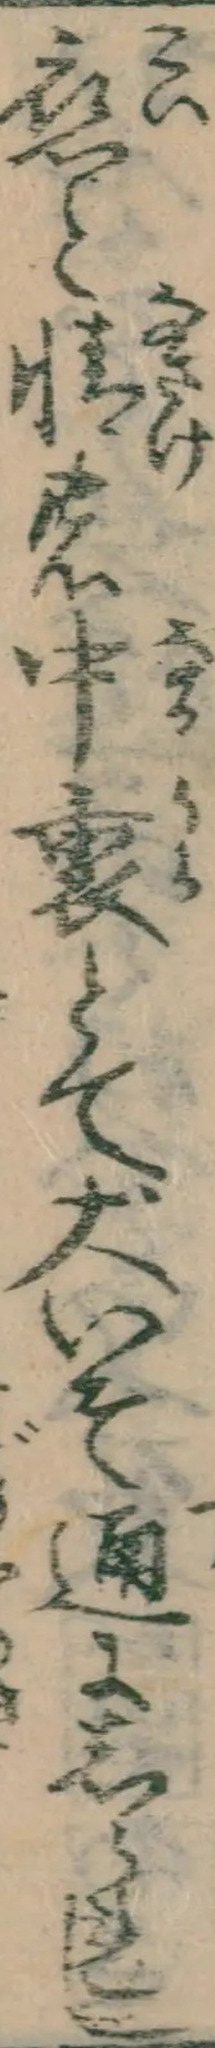恋と情の中裏とて大いそ通にしられし
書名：教訓読本：大礒風俗仕懸文庫
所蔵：国立国会図書館 National Diet Library, JAPAN
